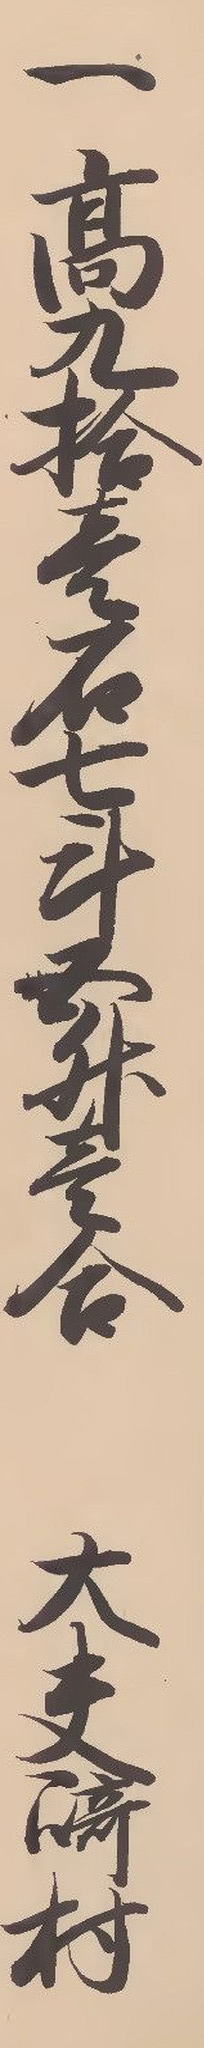一高九拾壱石七斗五升壱合大夫崎村
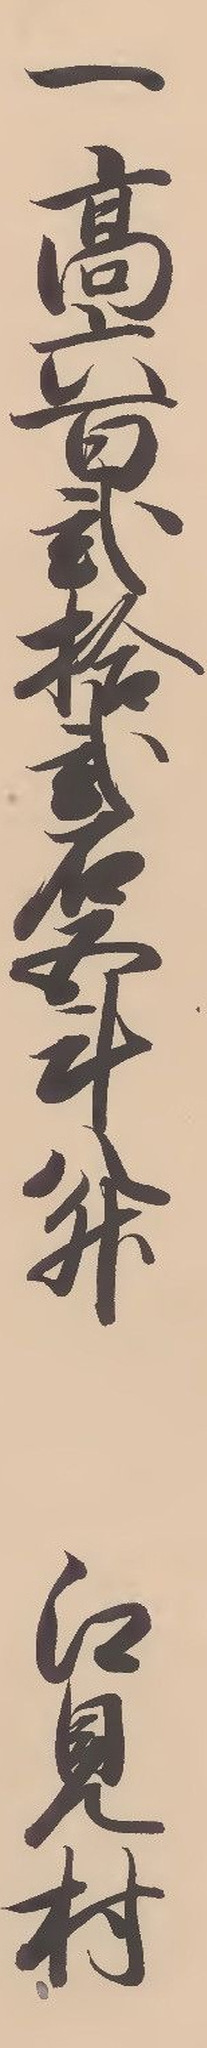一高六百弐拾弐石五斗八升江見村
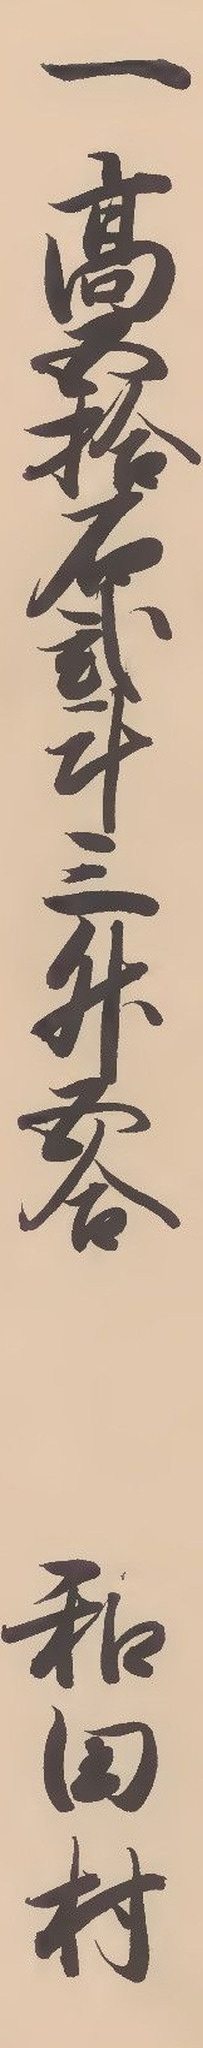一高五拾石弐斗三升五合和田村
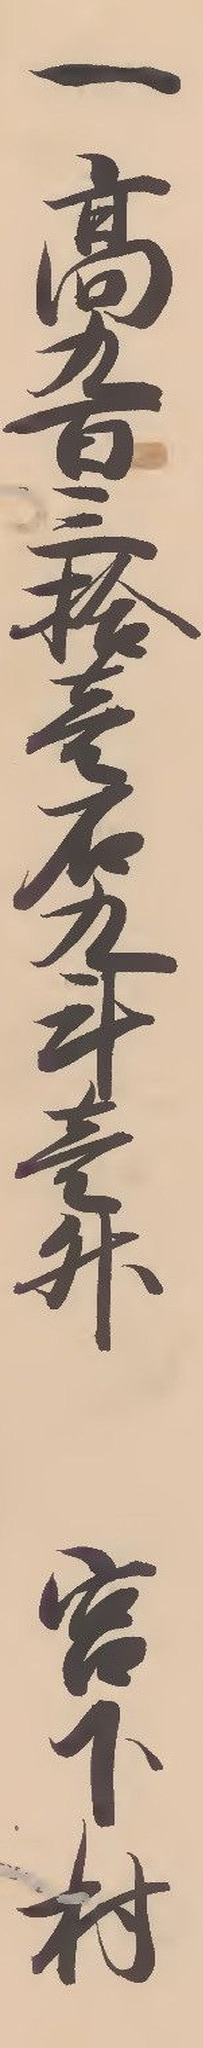一高九百三拾壱石九斗壱升宮下村

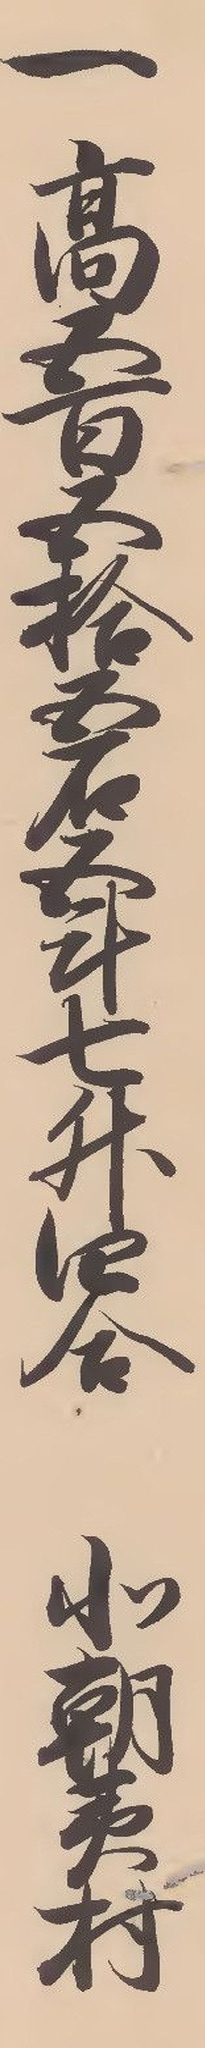一高五百五拾五石五斗七升四合北朝夷村
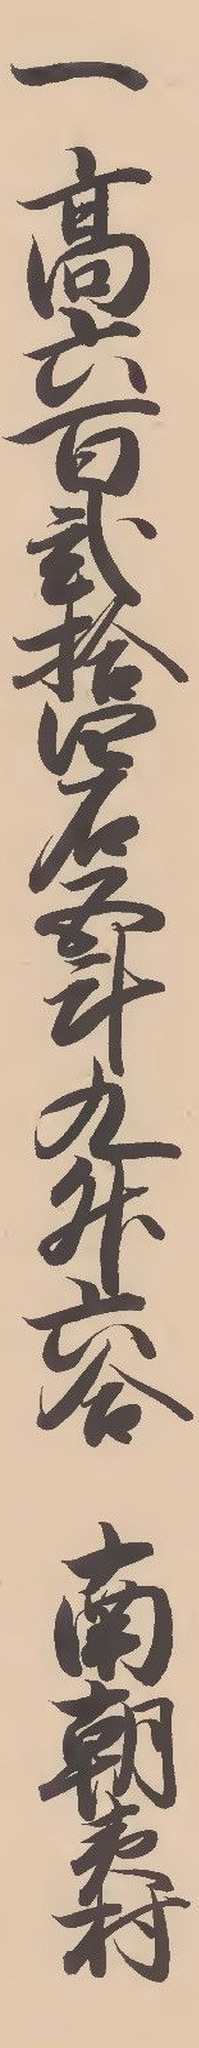一高六百弐拾四石五斗九升六合南朝夷村
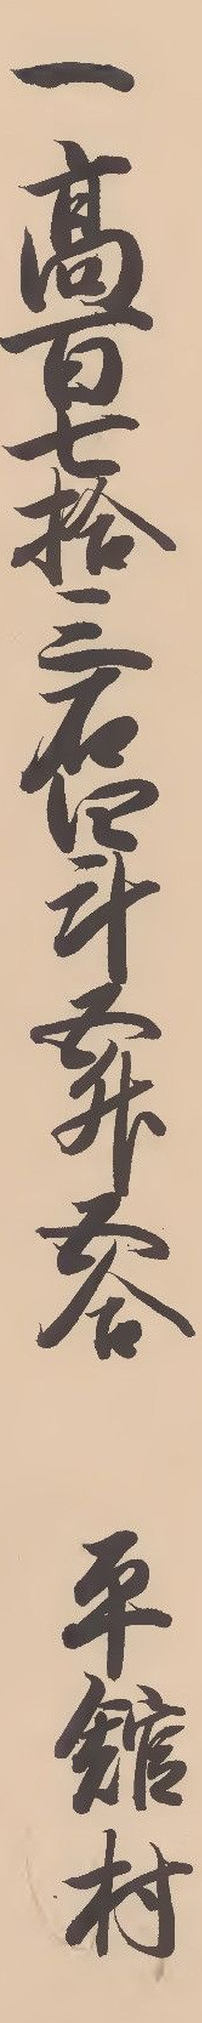一高百七拾三石四斗五升五合平館村
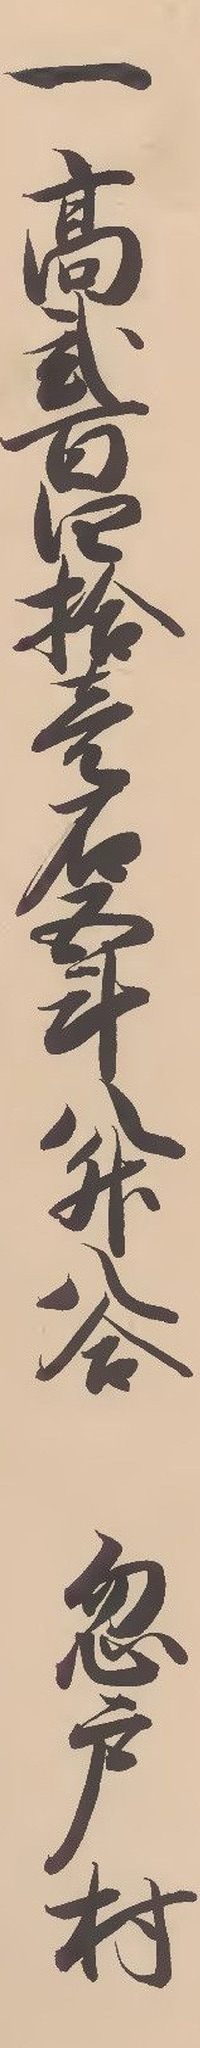一高弐百四拾壱石五斗八升八合忽戸村
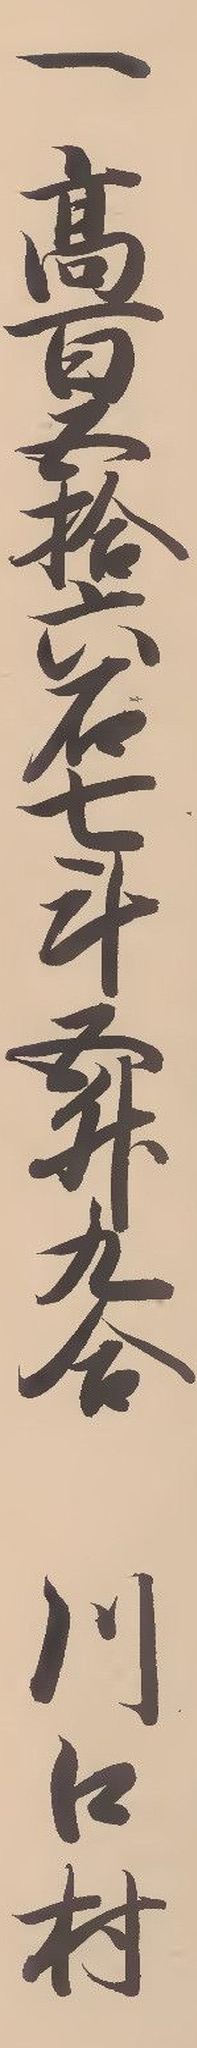一高百五拾六石七斗五升九合川口村
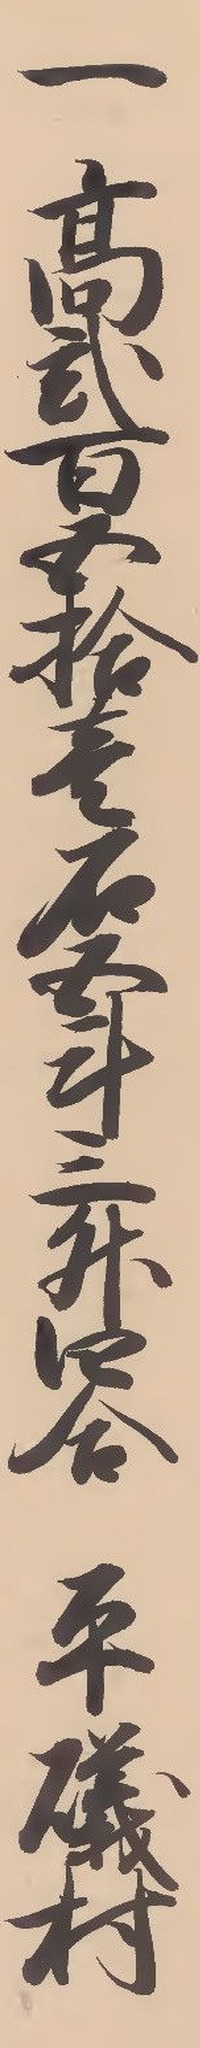一高弐百五拾壱石五斗三升四合平磯村
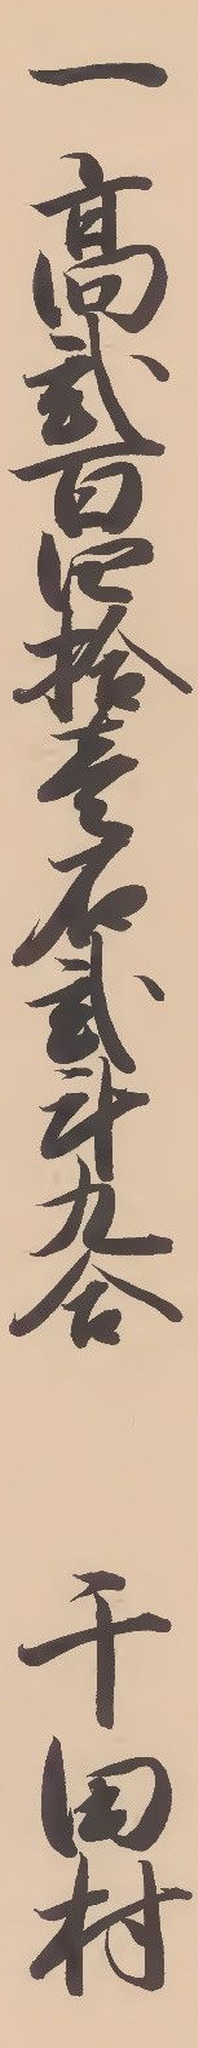一高弐百四拾壱石弐斗九合千田村
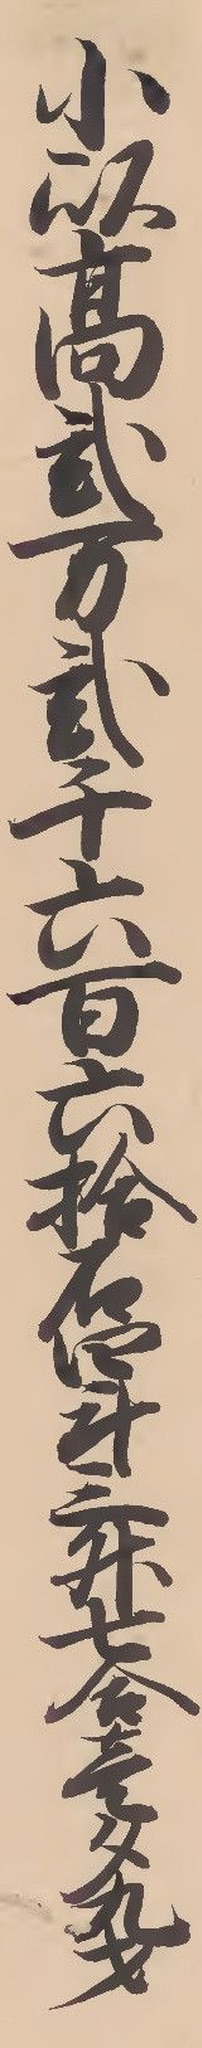小以高弐万弐千六百六拾石四斗三升七合壱勺九才

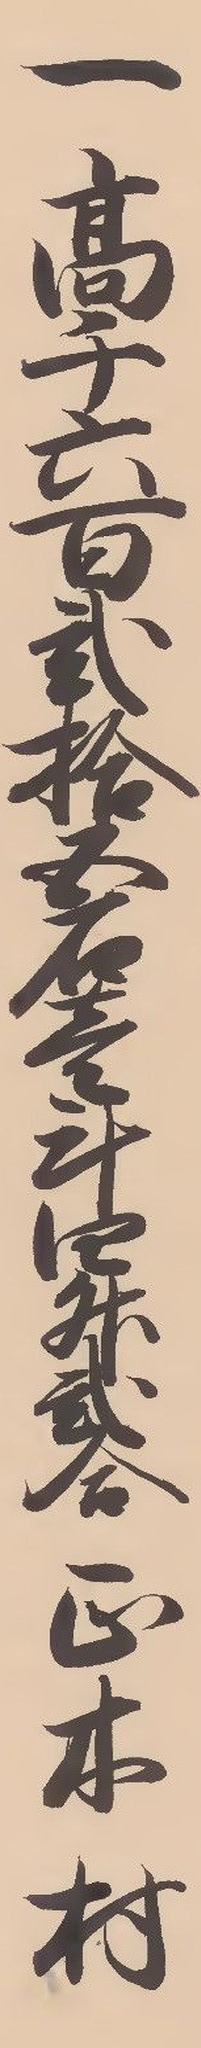一高千六百弐拾五石壱斗四升弐合正木村
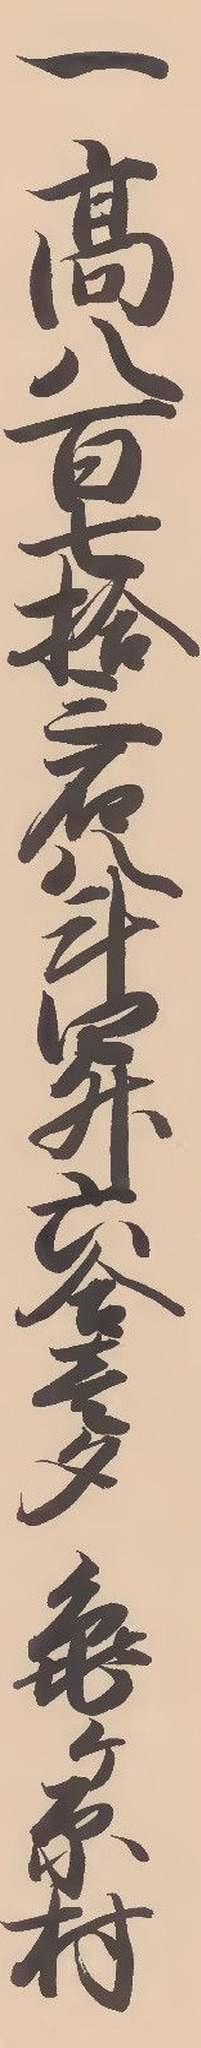一高八百七拾三石八斗四升六合壱勺亀ヶ原村
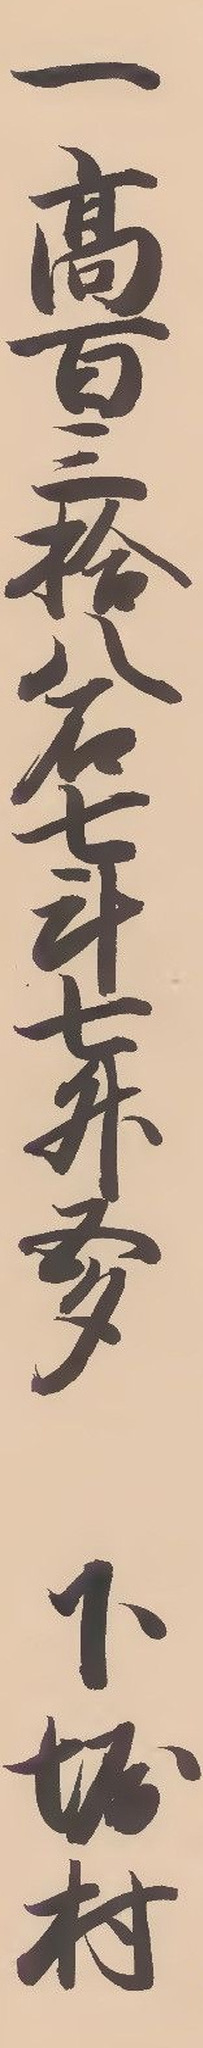一高百三拾八石七斗七升五勺下堀村

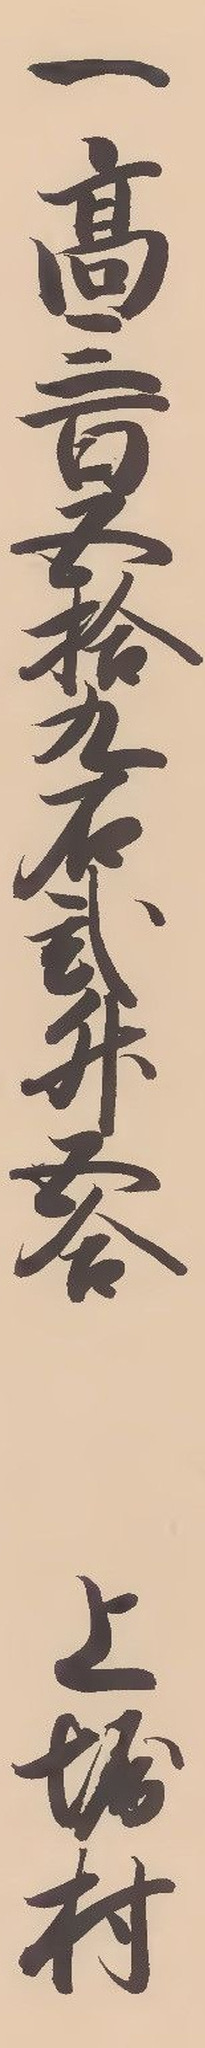一高三百五拾九石弐升五合上堀村
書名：安房国郷帳
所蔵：国立公文書館 National Archives of Japan
